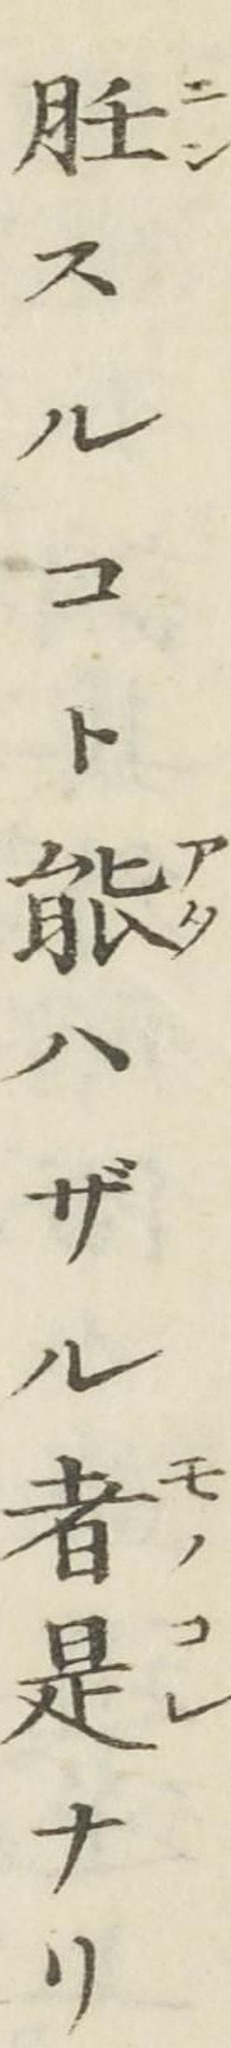妊スルコト能ハザル者是ナリ
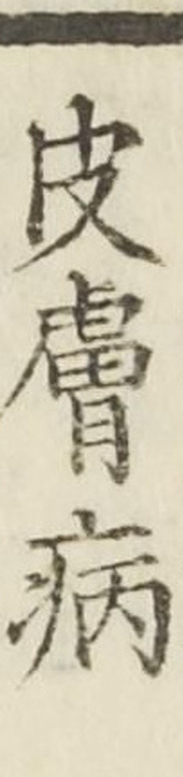皮膚病
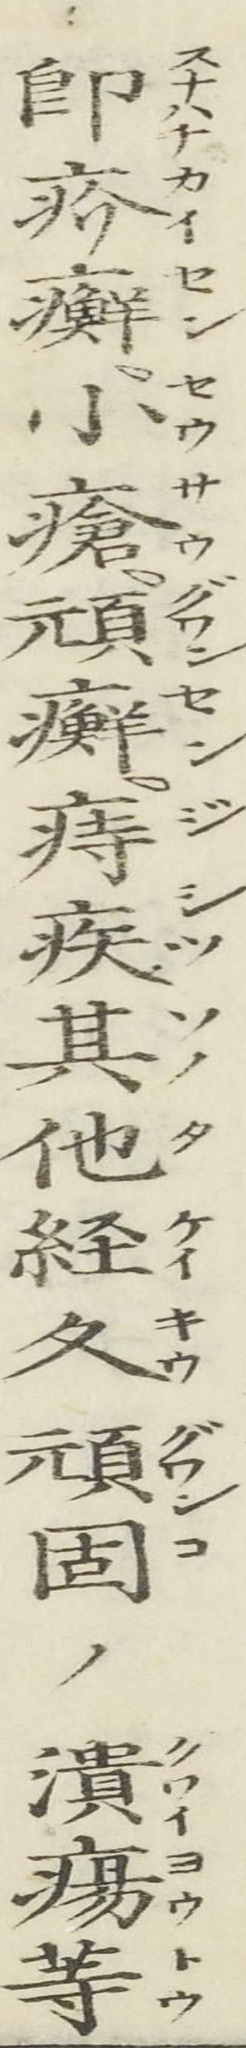即疥癬、小瘡、頑癬、痔疾其他経久頑固ノ潰瘍等
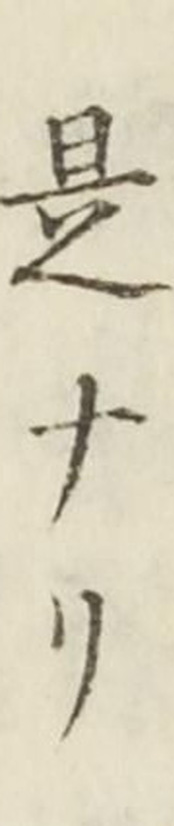是ナリ
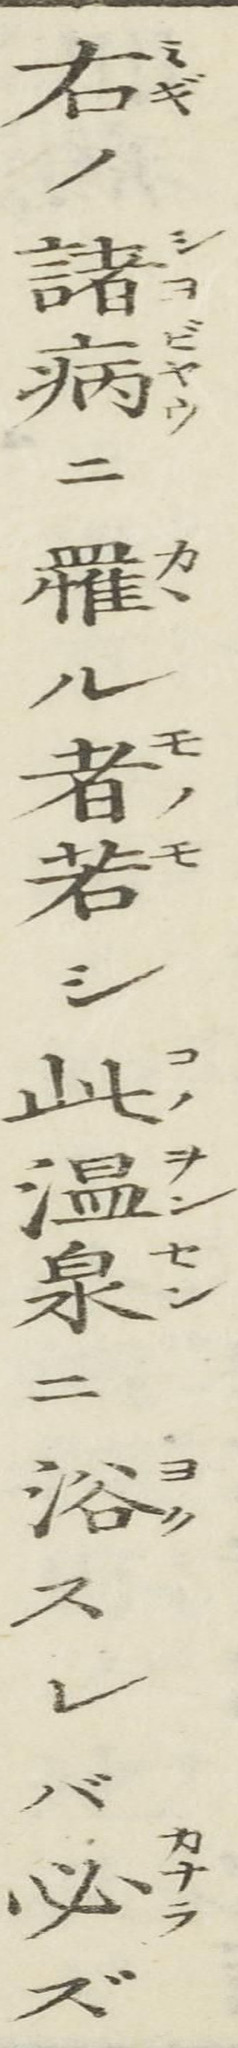右ノ諸病ニ罹ル者若シ此温泉ニ浴スレバ必ズ
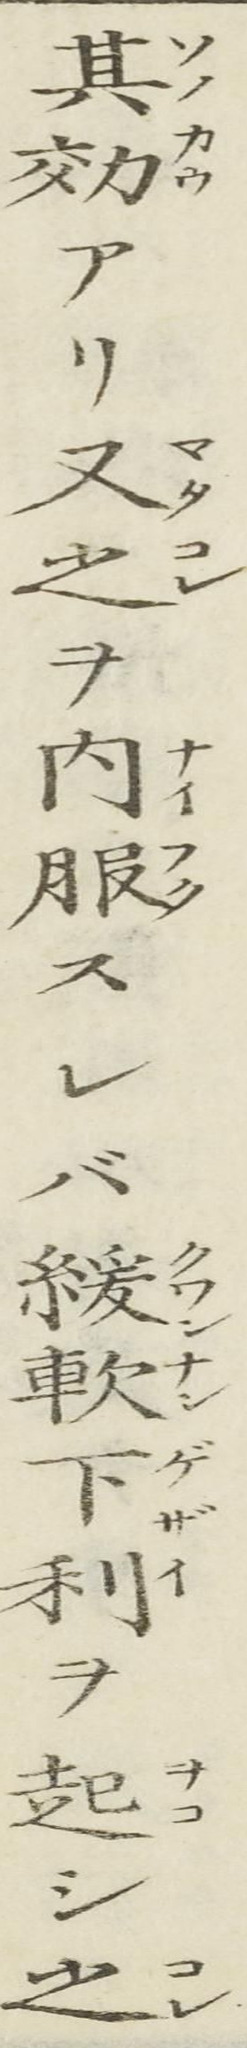其効アリ又之ヲ内服スレバ緩軟下利ヲ起シ之
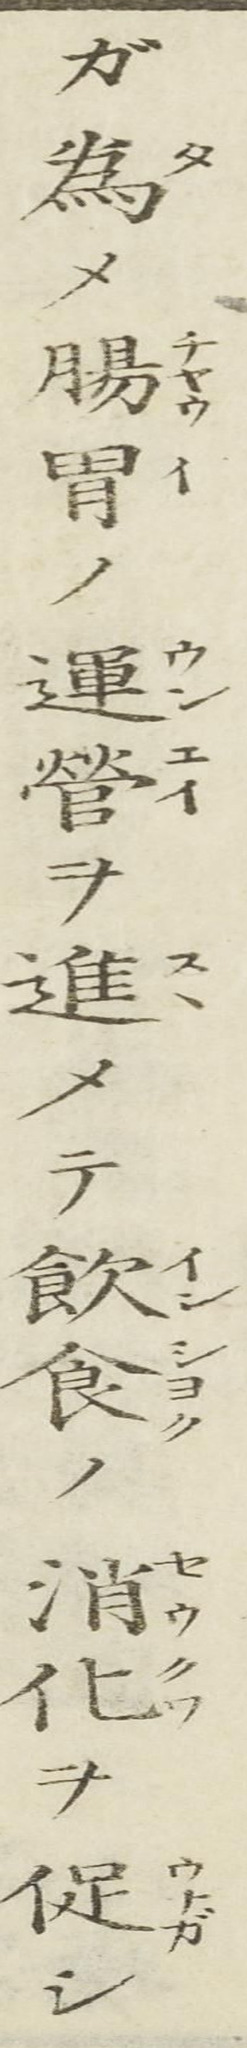ガ為メ腸胃ノ運営ヲ進メテ飲食ノ消化ヲ促シ
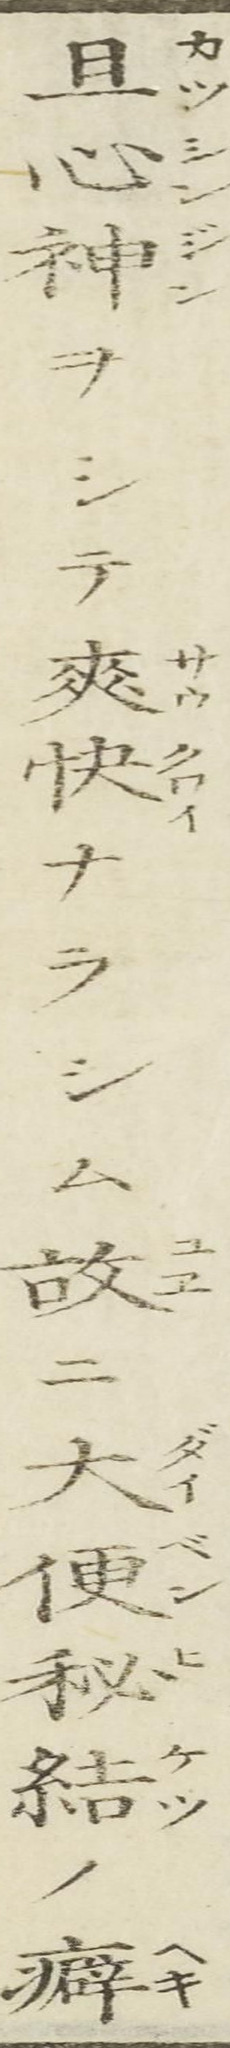且心神ヲシテ爽快ナラシム故ニ大便秘結ノ癖
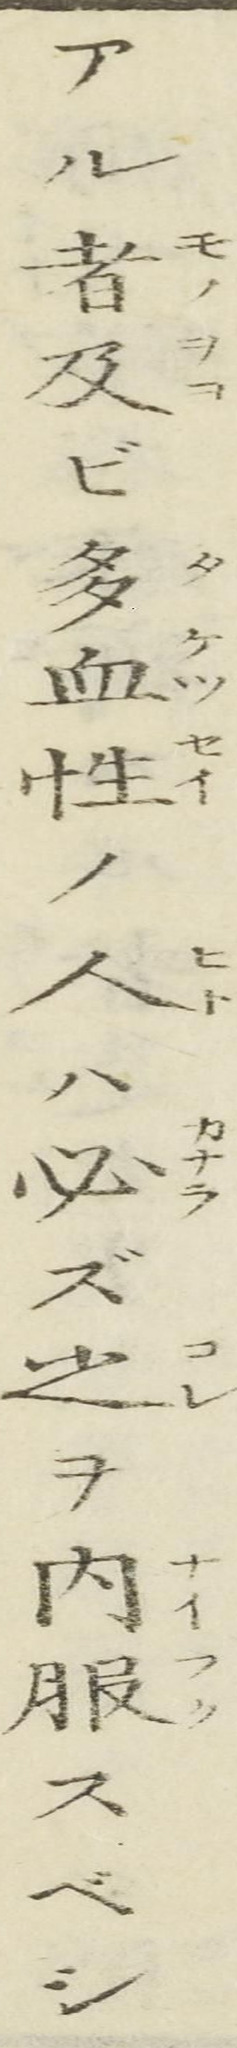アル者及ビ多血性ノ人ハ必ズ之ヲ内服スベシ
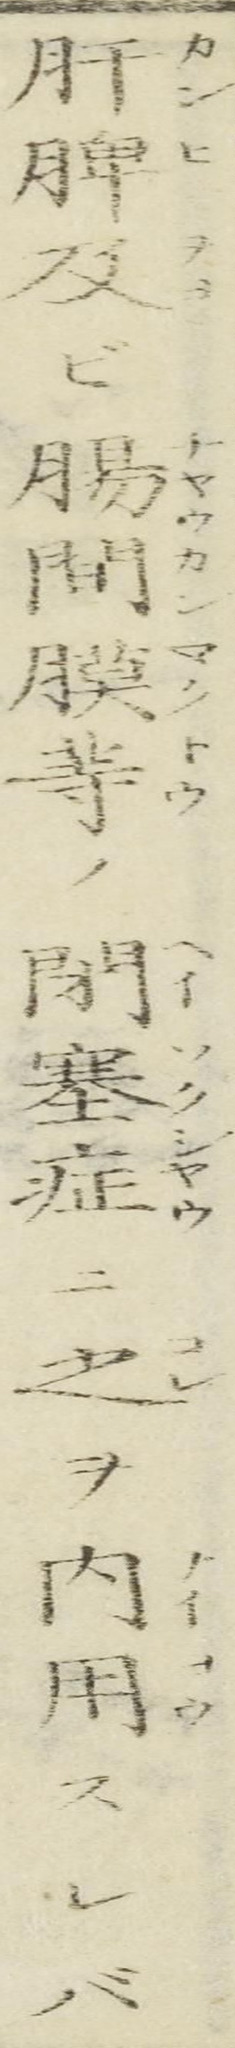肝脾及ビ腸間膜等ノ閉塞症ニ之ヲ内用スレバ
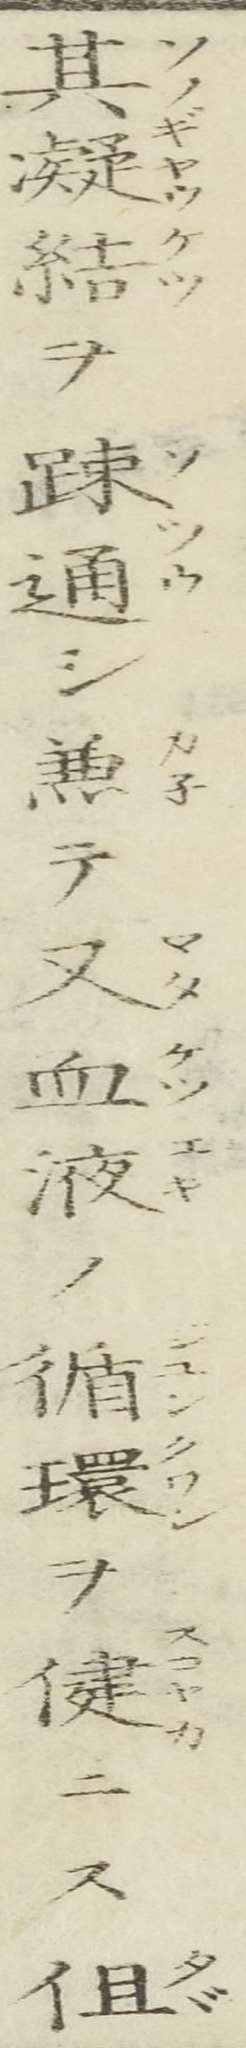其凝結ヲ疎通シ兼テ又血液ノ循環ヲ健ニス伹
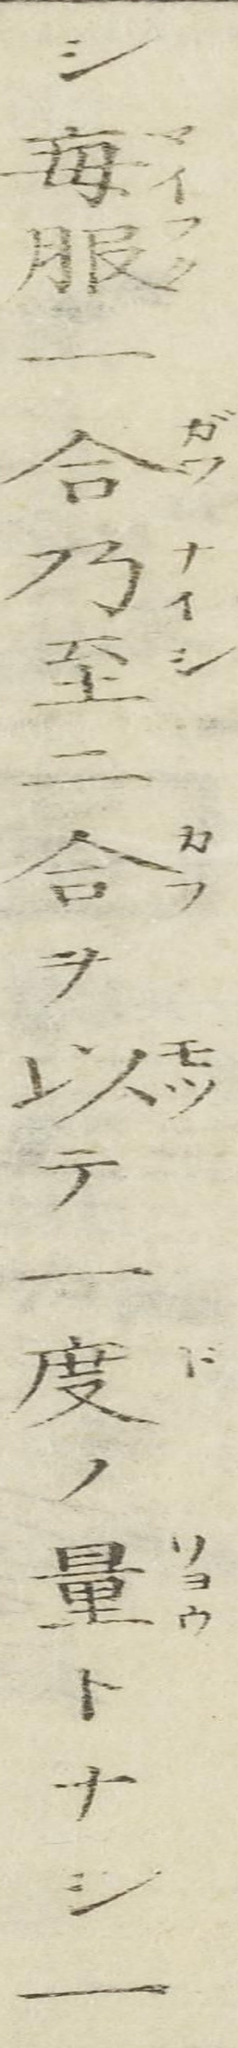シ毎服一合乃至二合ヲ以テ一度ノ量トナシ一
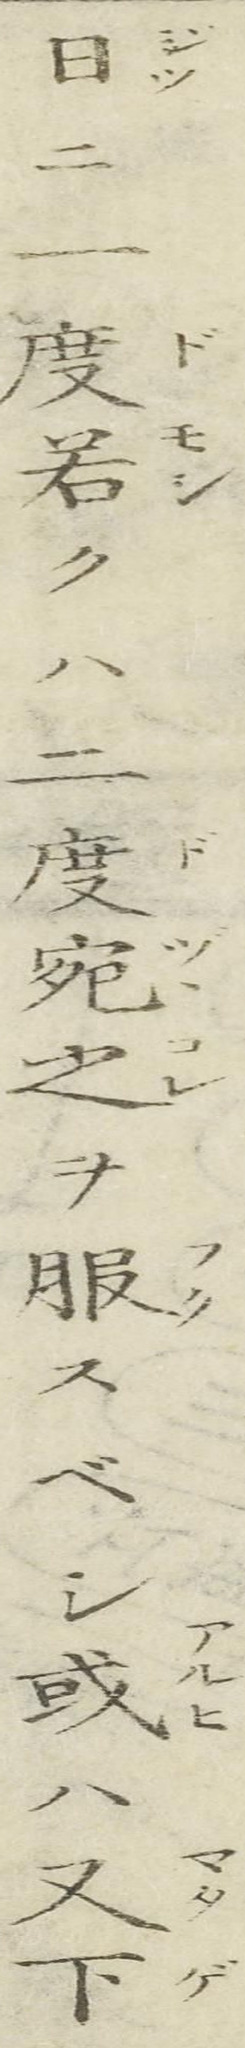日ニ一度若クハ二度宛之ヲ服スベシ或ハ又下
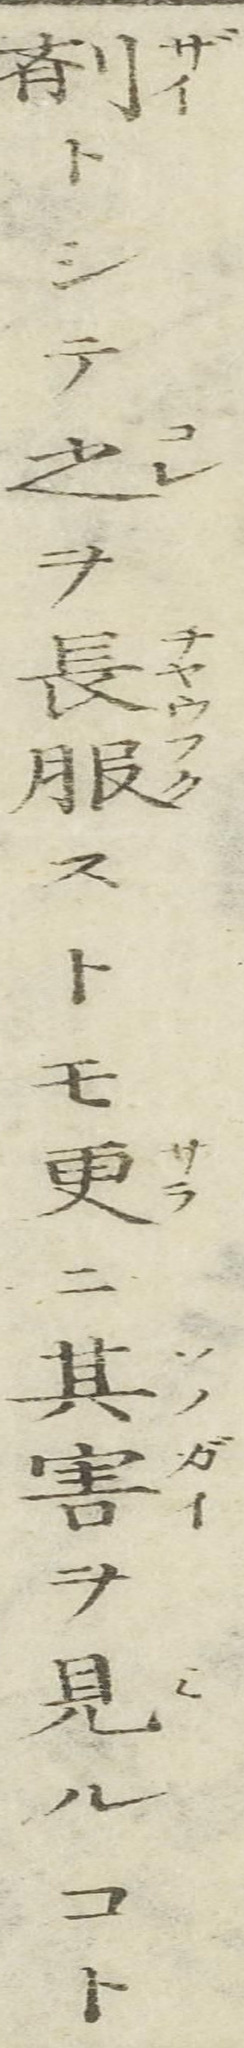剤トシテ之ヲ長服ストモ更ニ其害ヲ見ルコト
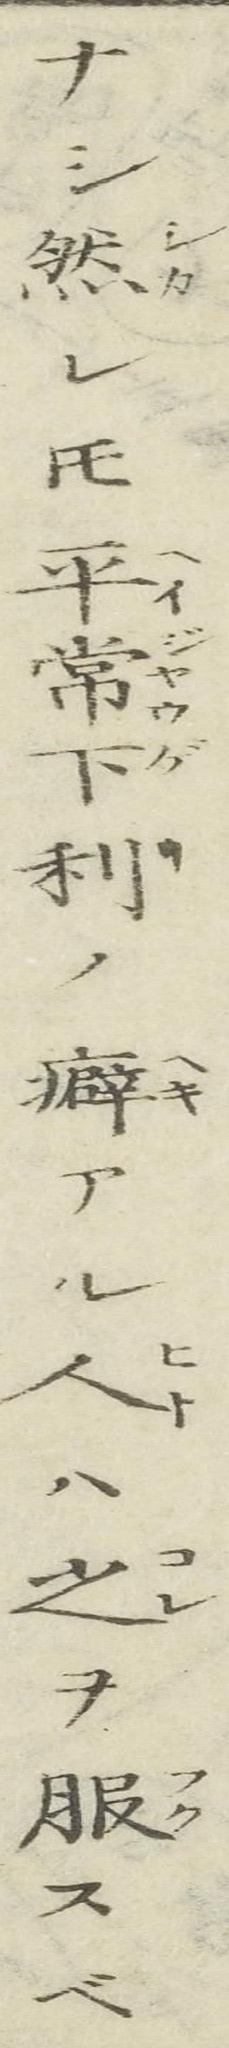ナシ然レ共平常下利ノ癖アル人ハ之ヲ服スベ
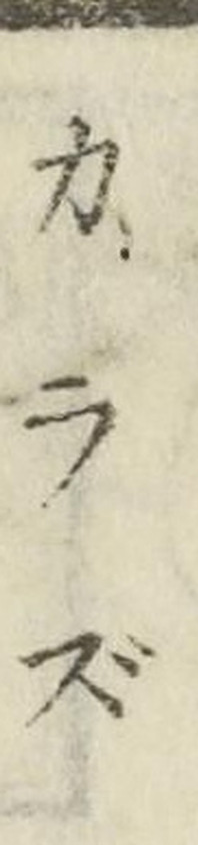カラズ
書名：熱海温泉考　全
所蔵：東京大学地震研究所図書室 Earthquake Research Institute Library, The University of Tokyo, JAPAN
